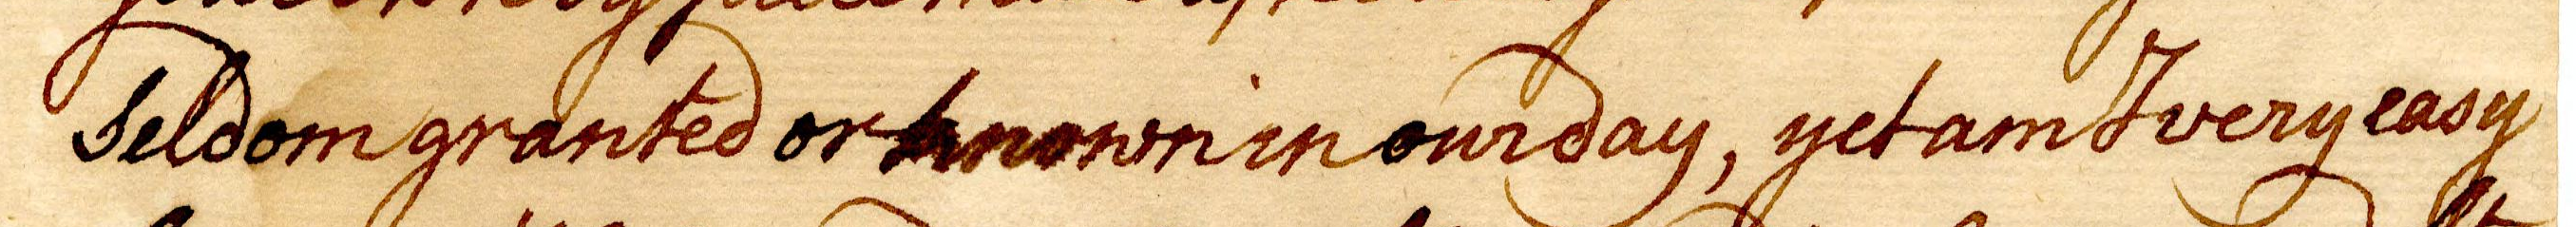Seldom granted or known in our day, yet am I very easy
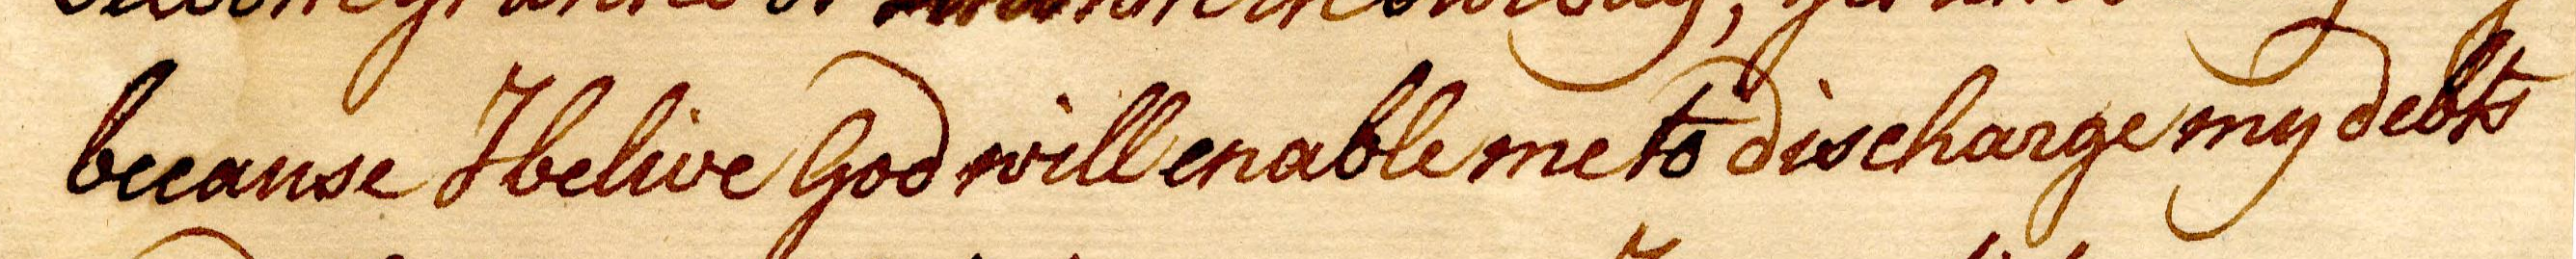because I belive God will enable me to discharge my debts
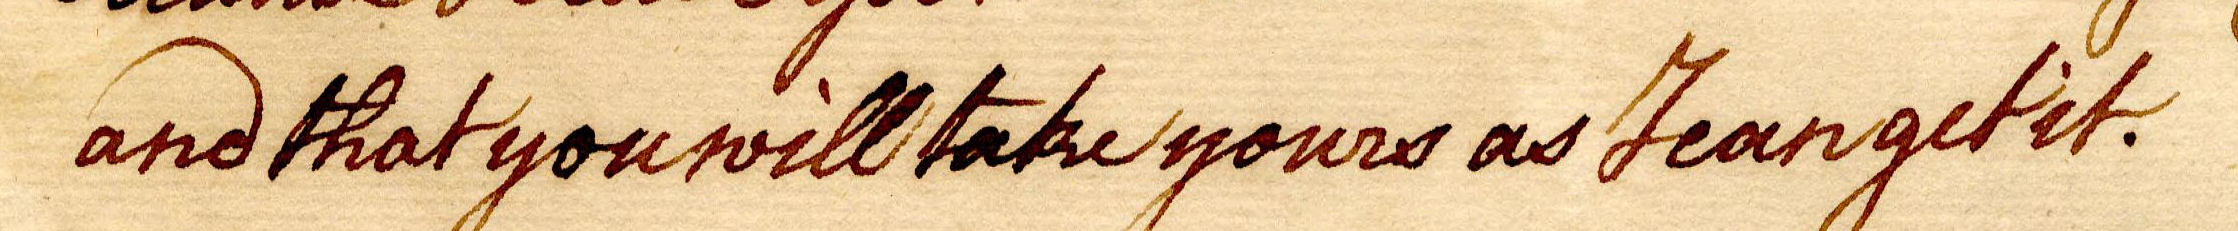and that you will take yours as I can get it.
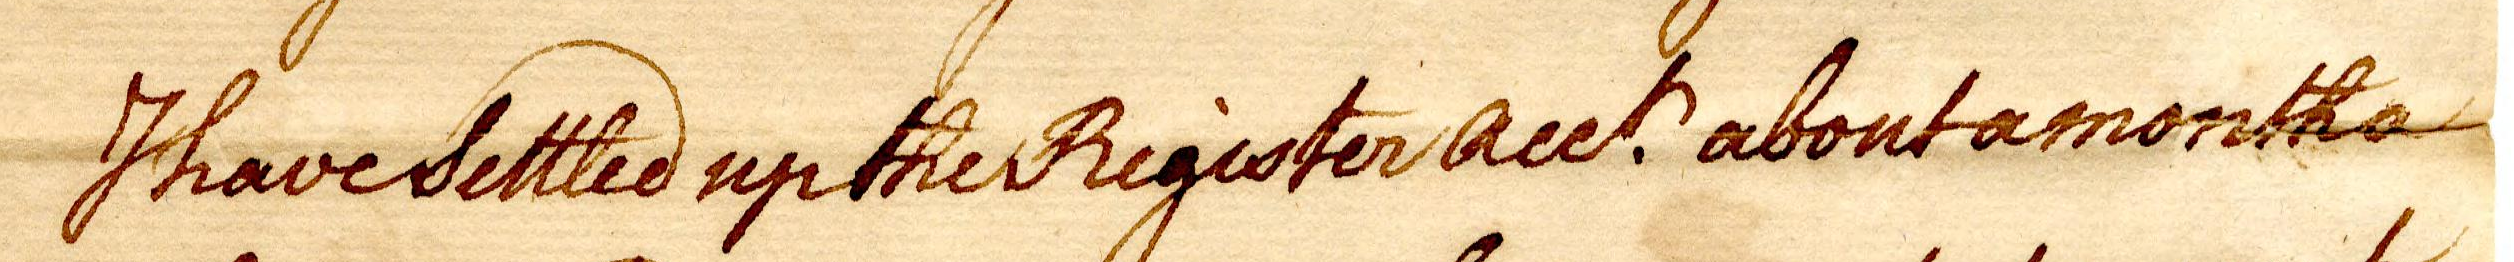I have settled up the Register Acc^t. about a month a
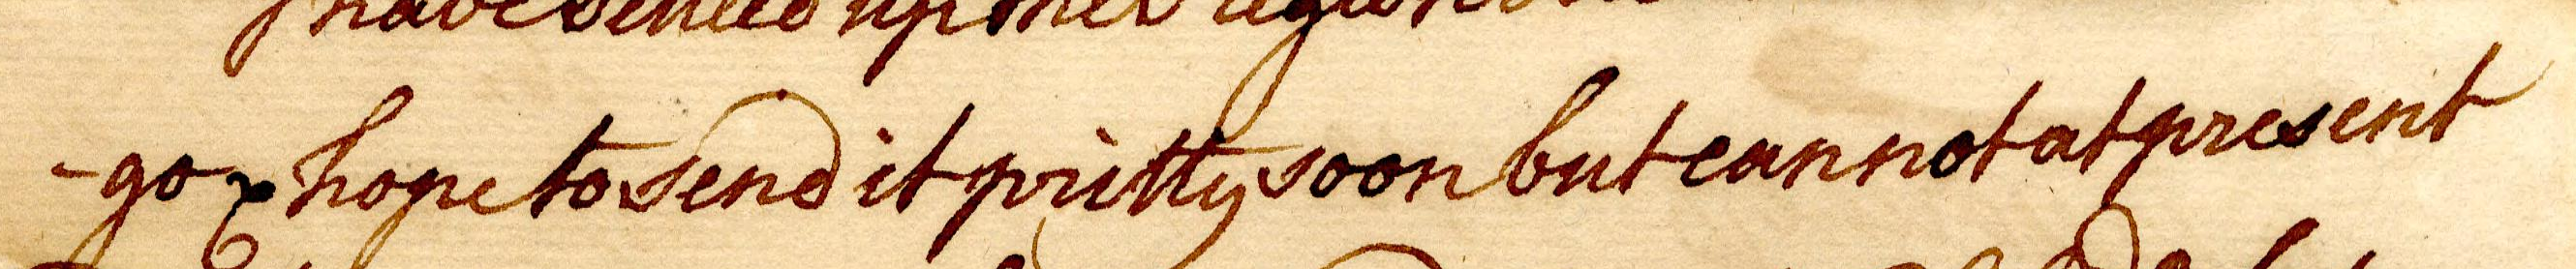-go & hope to send it pritty soon but cannot at present
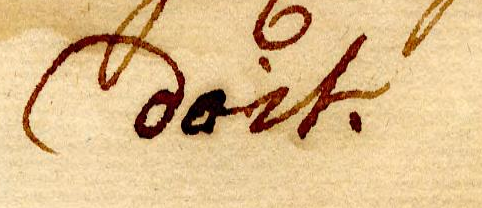do it.
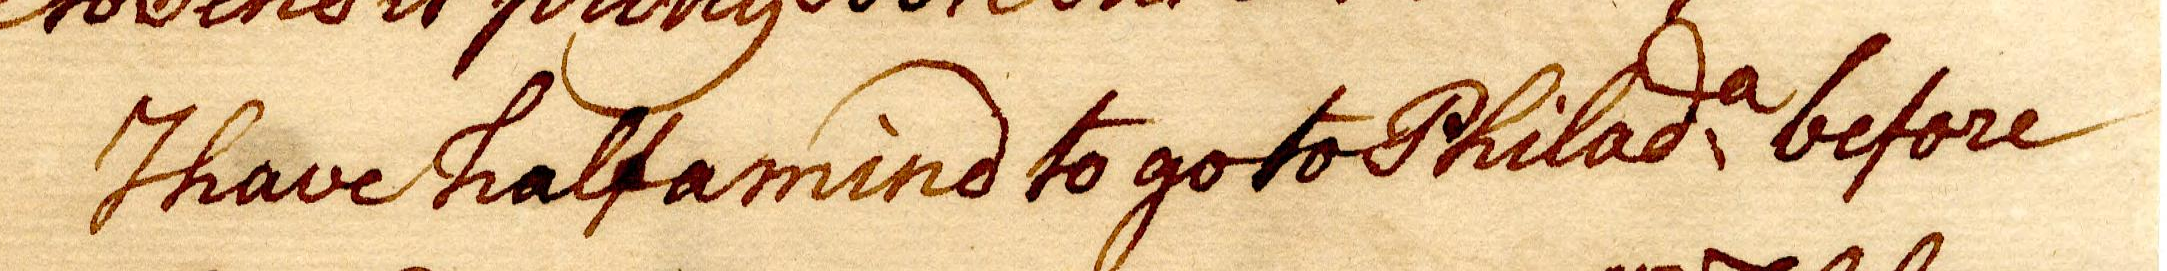I have half a mind to go to Philad^a. before
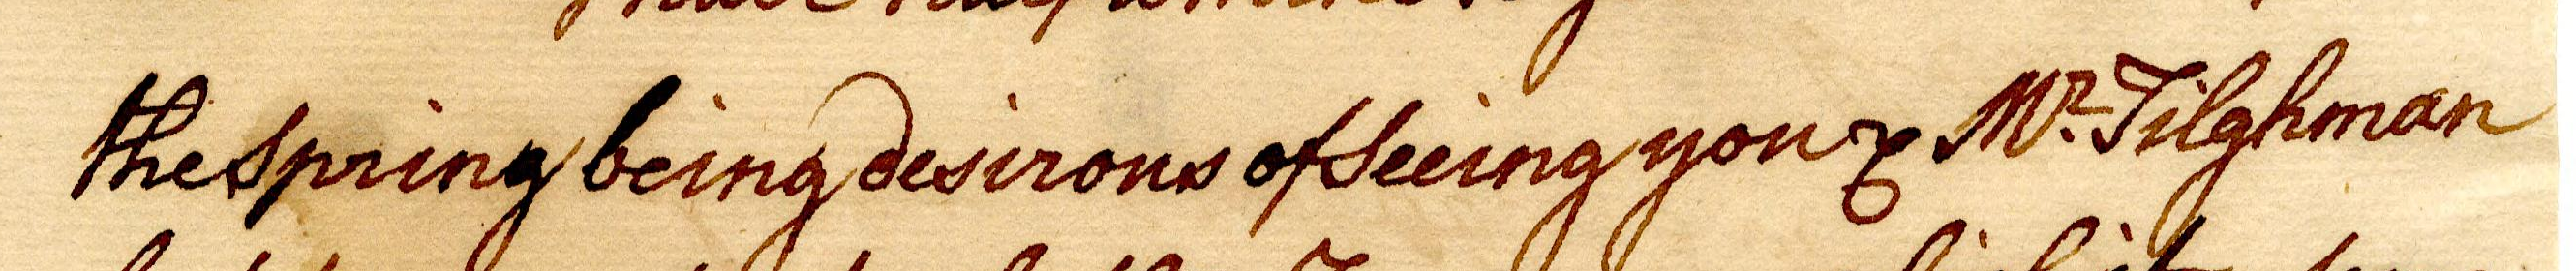the Spring being desirous of seeing you & Mr. Tilghman
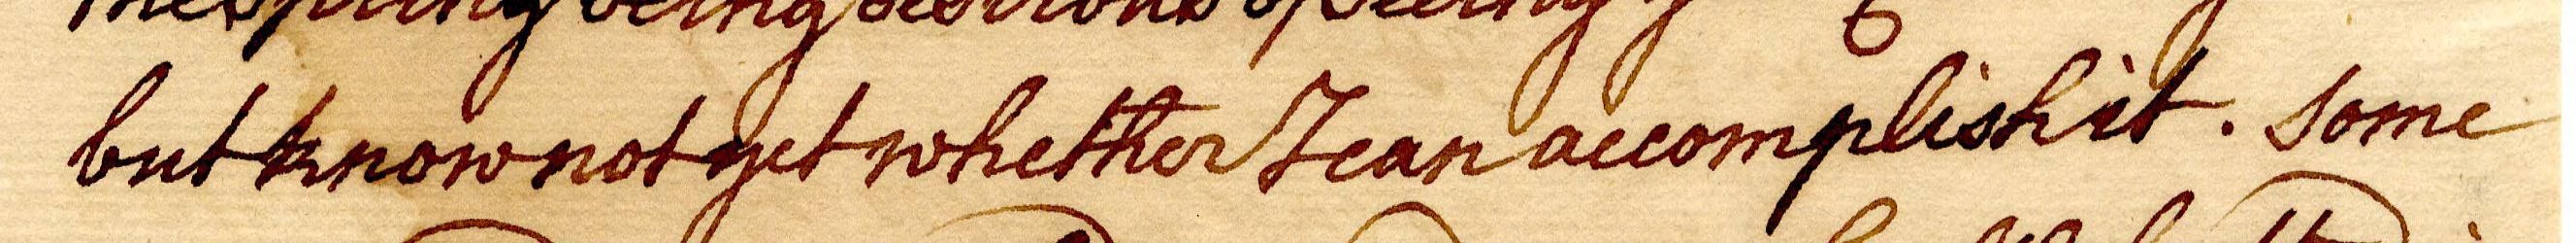but know not yet whether I can accomplish it. Some
